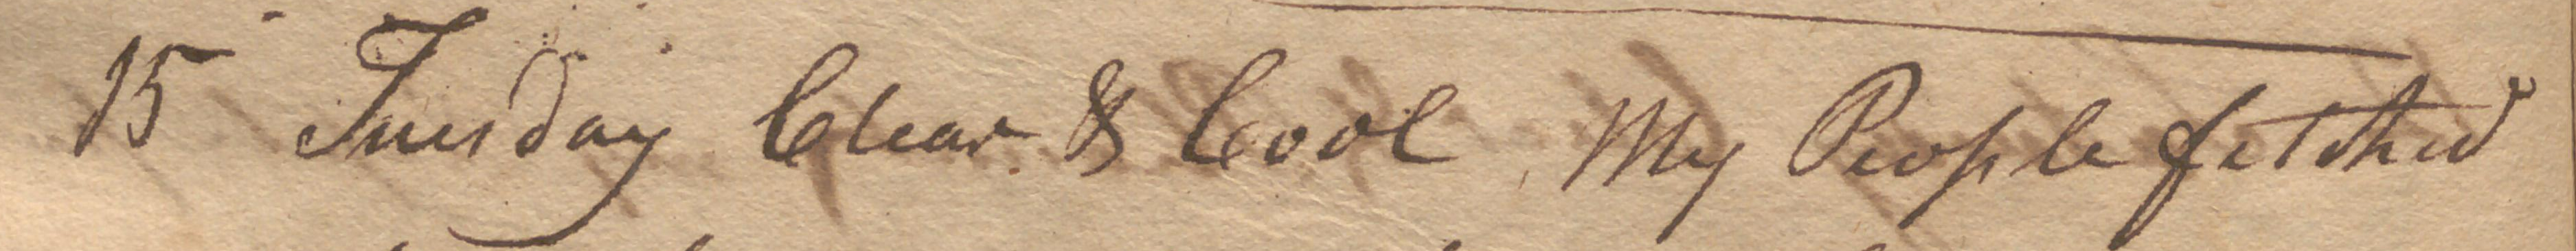15 Tuesday Clear & Cool My People fetched
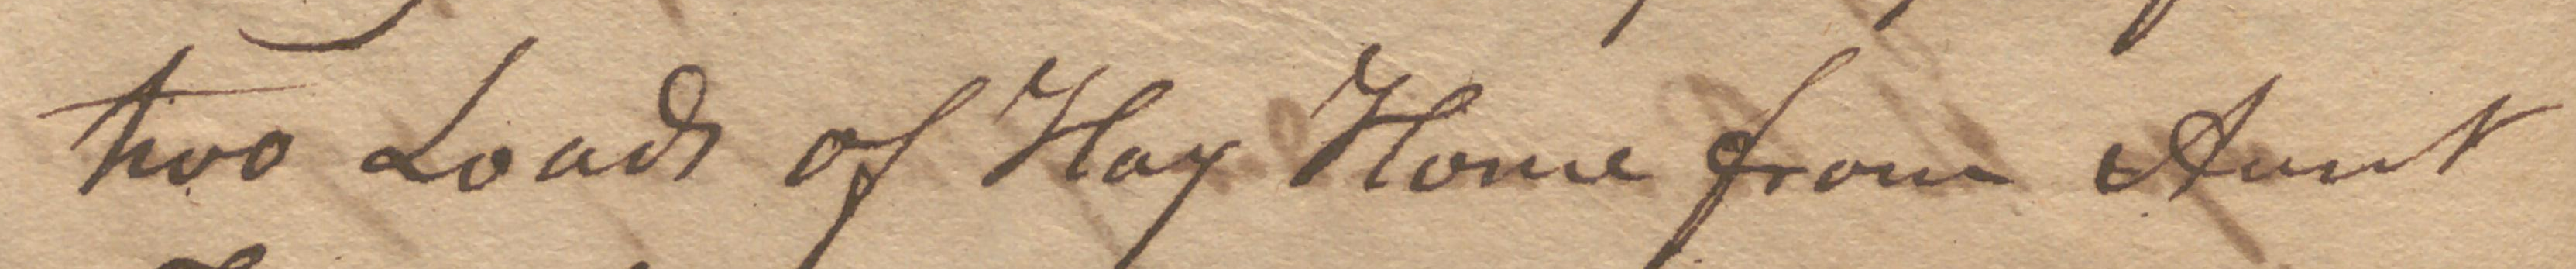two Loads of Hay Home from Aunt
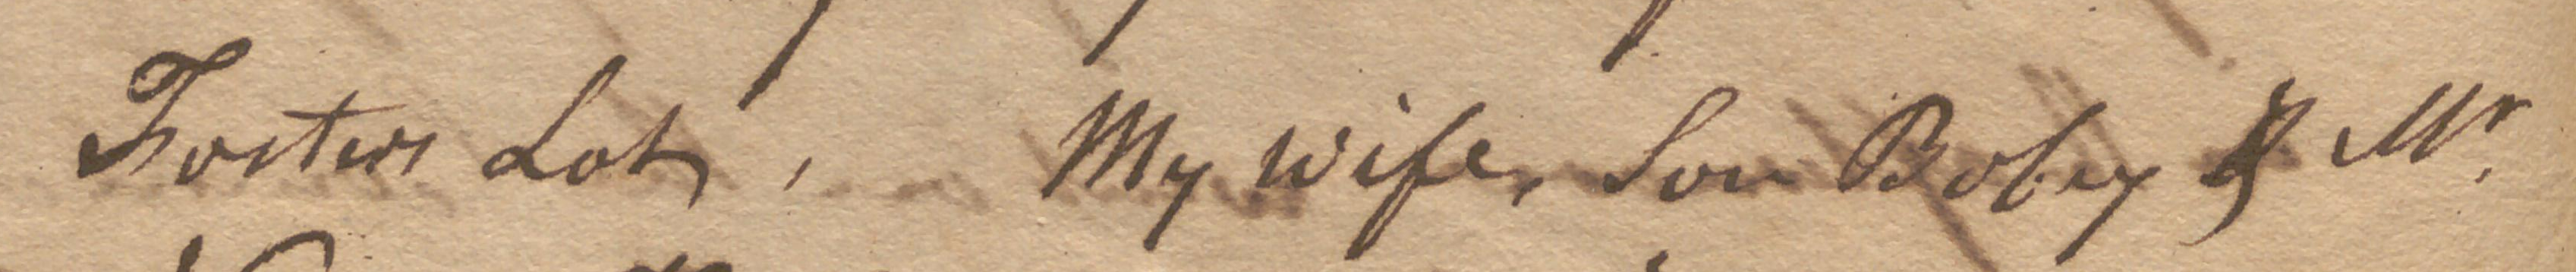Fosters Lot. My wife, son Bobey & M^r.
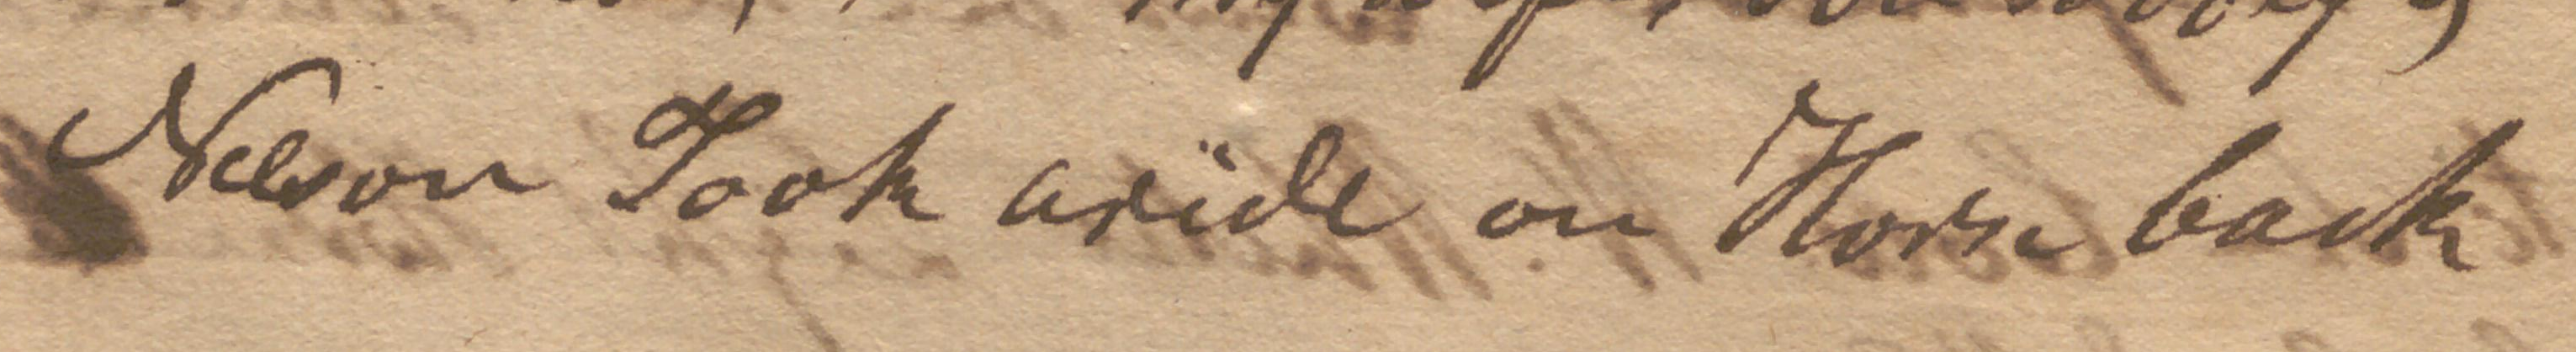Nelson Took a ride on Horse back
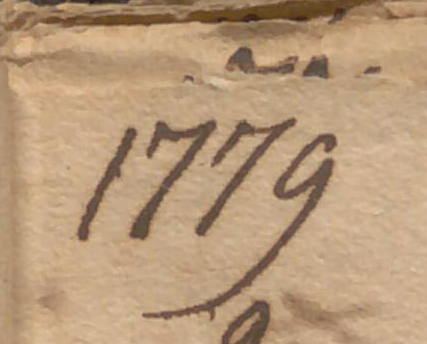1779
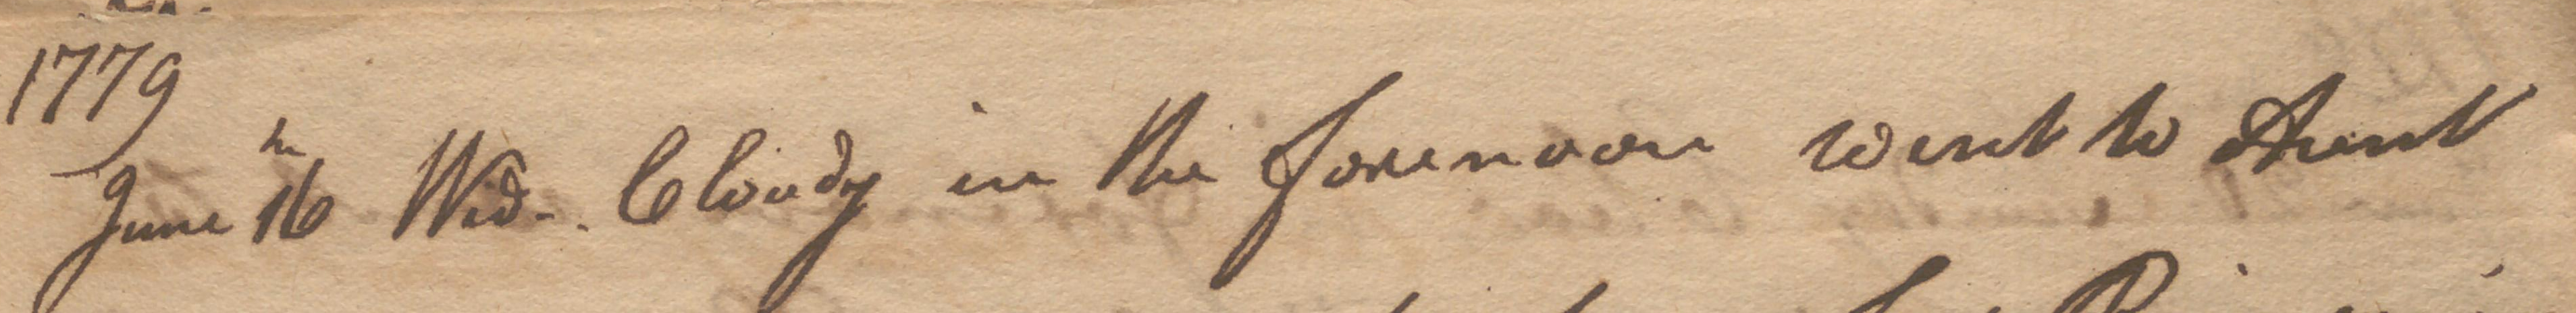June 16^th Wed. Cloudy in the forenoon went to Aunt
